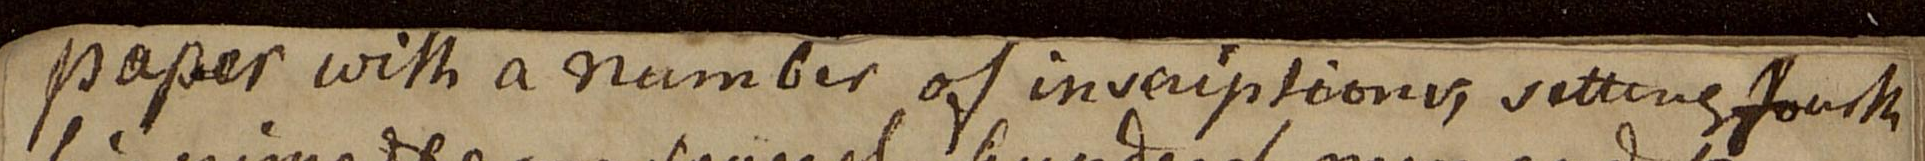paper with a number of inscriptions, setting fourth
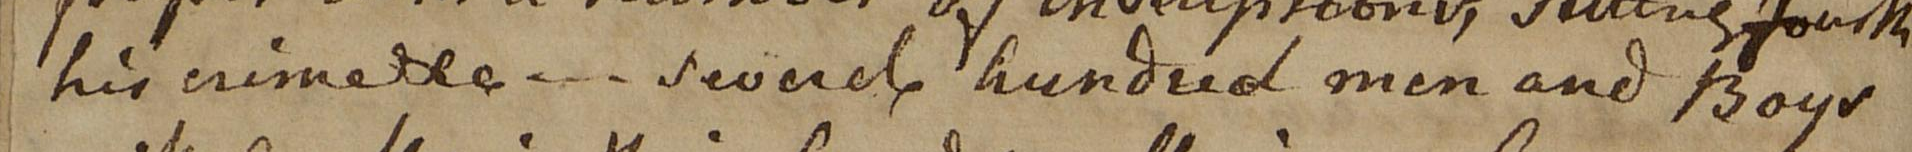his crime &c-- severel hundred men and Boys
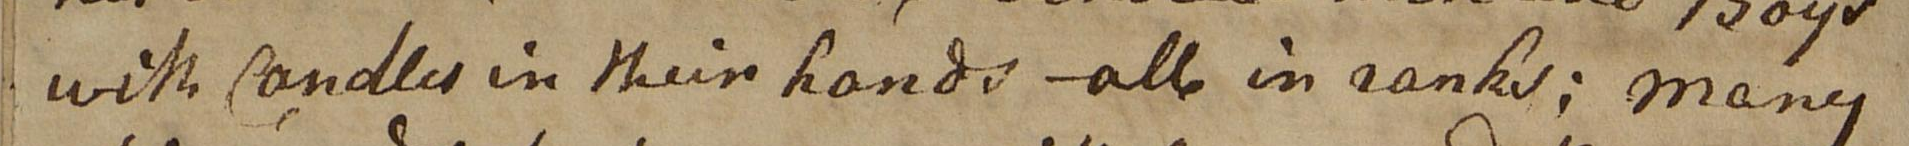with Candles in their hands-all in ranks; many
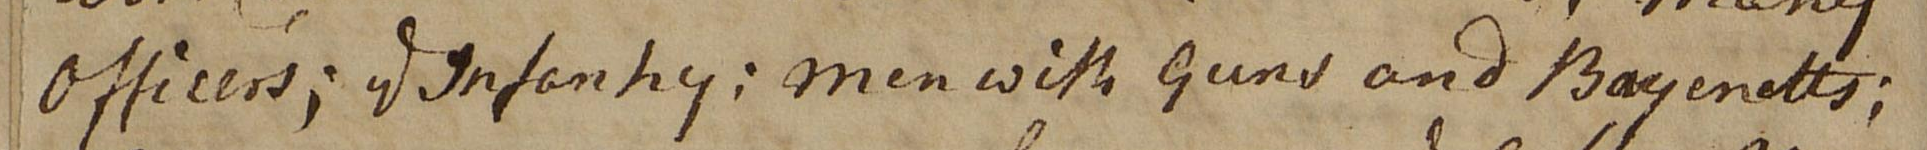Officers; y^e Infantry: men with Guns and Bayenetts;
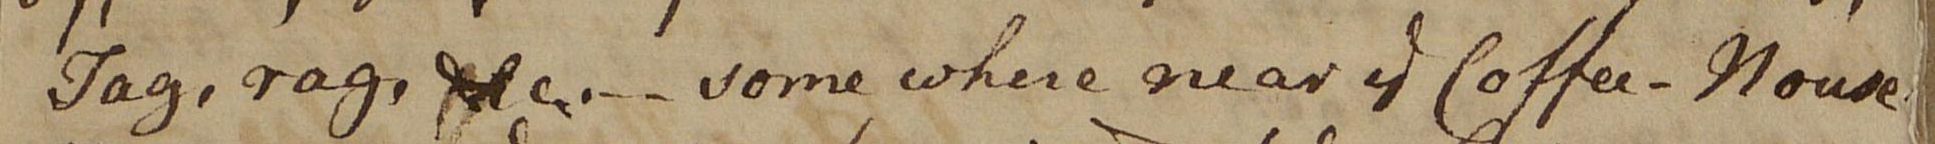Tag, rag, &c- some where near y^e Coffee- House
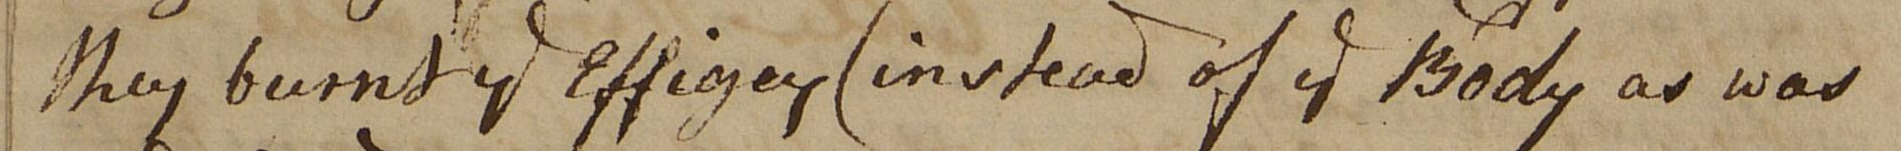they burnt y^e Effigey (instead of y^ Body as was
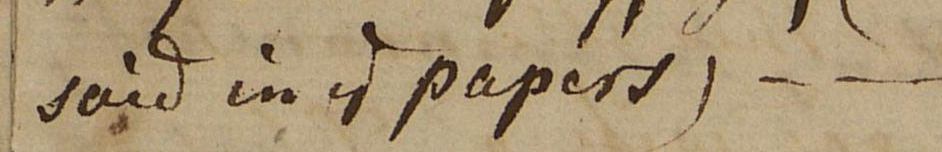said in y^e papers)--
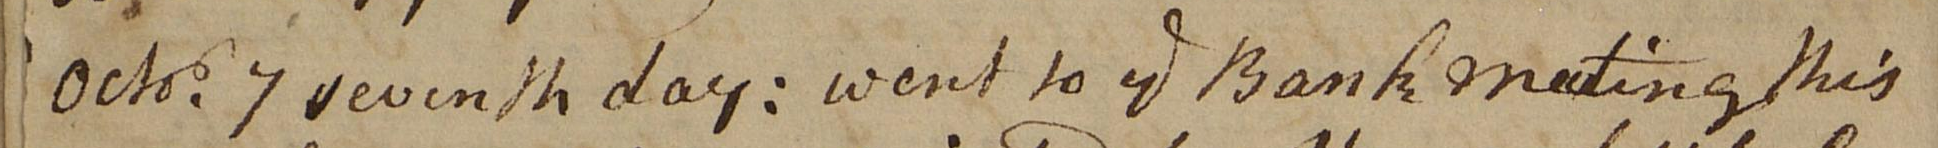Octo^b. 7 seventh day: went to y^e Bank meeting this
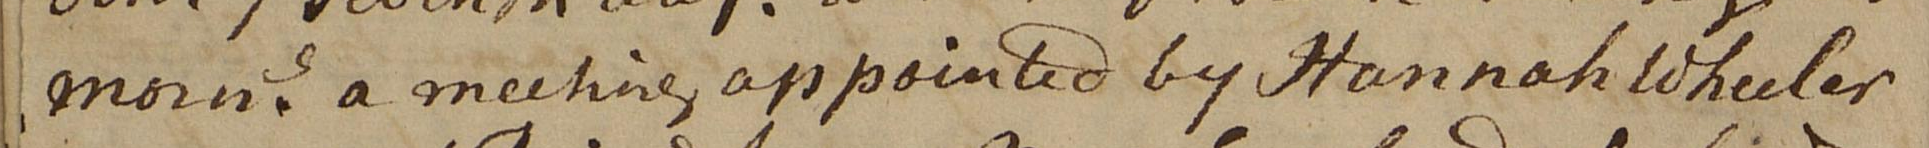morn^g. a meeting appointed by Hannah Wheeler
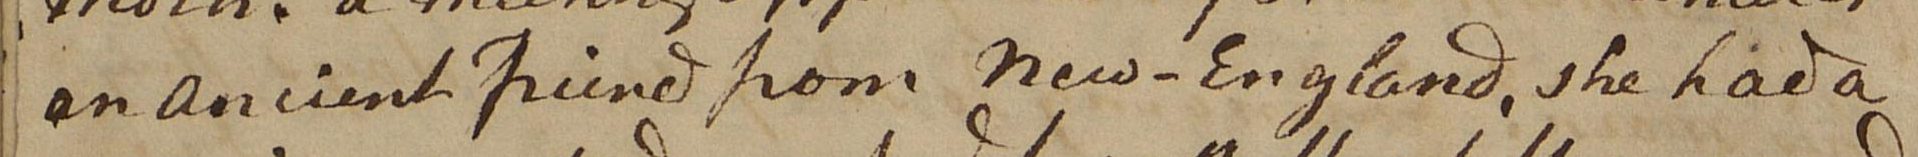an Ancient friend from new-England, she had a
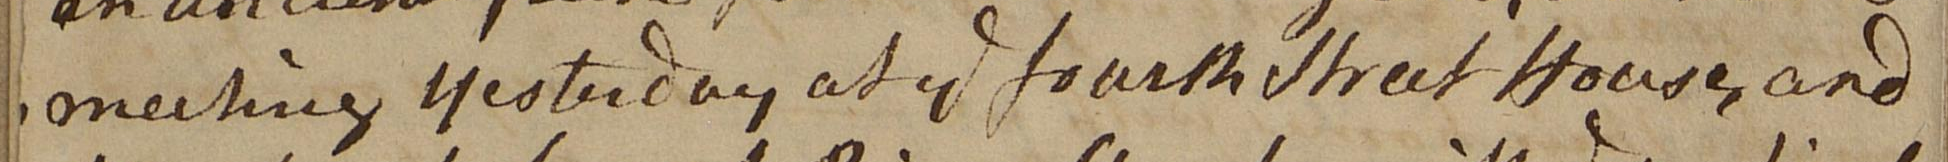meeting Yesterday at y^e fourth Street House, and
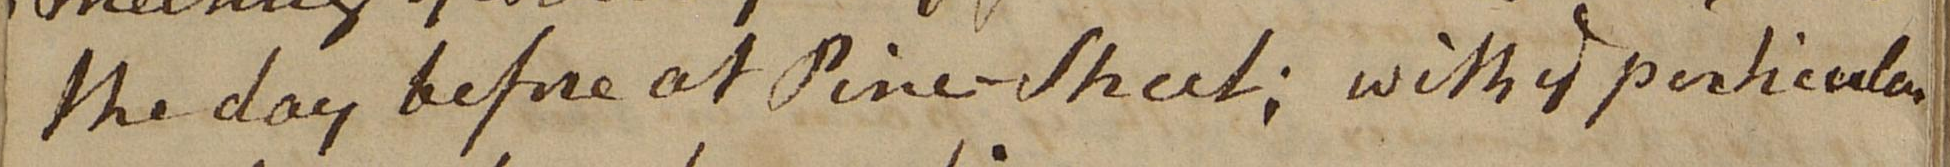the day before at Pine-Street; with y^e particular
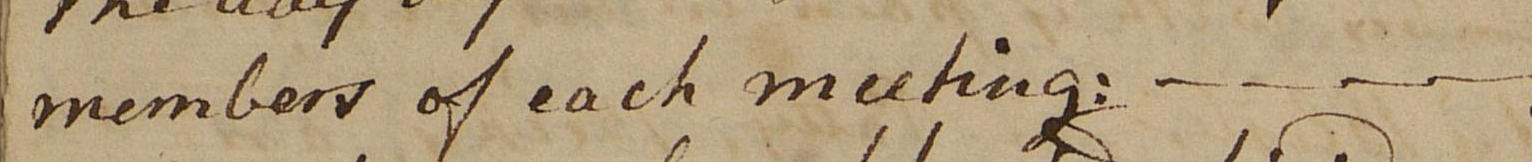members of each meeting:---
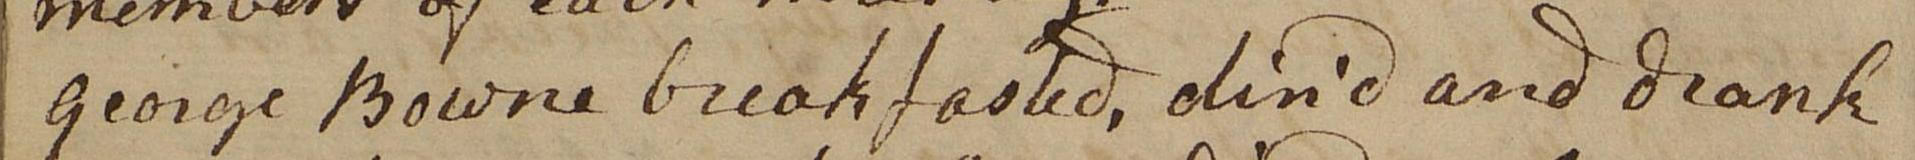George Bowne breakfasted, din'd and drank
